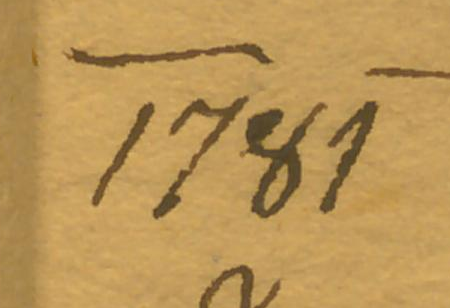1781
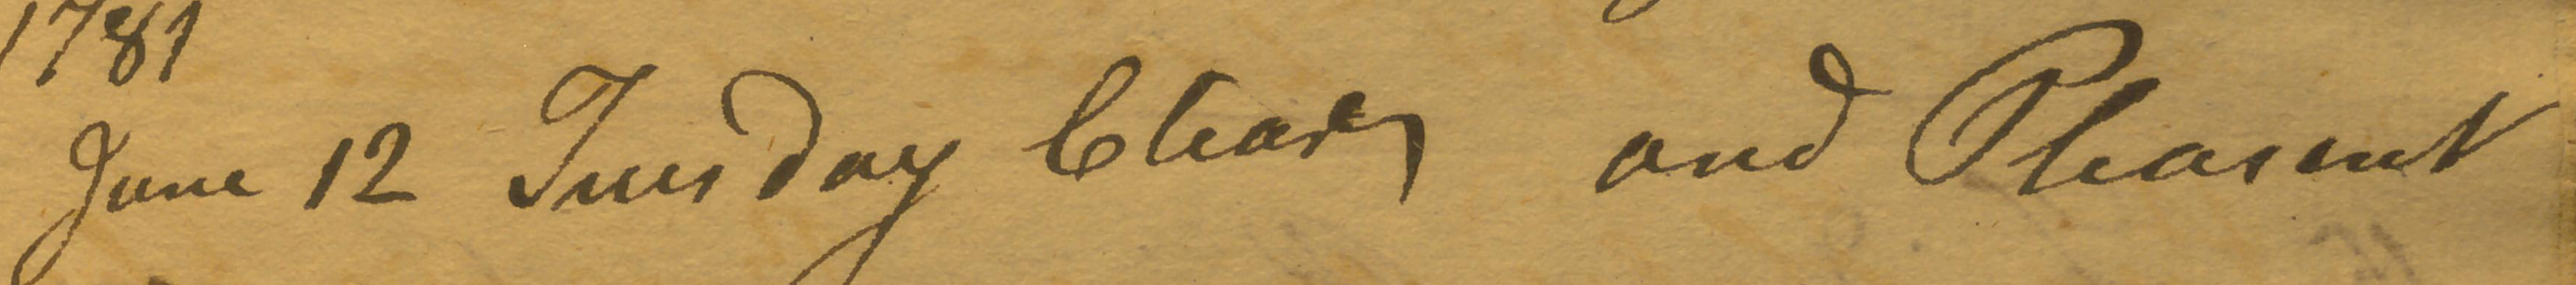June 12 Tuesday Clear and Pleasent
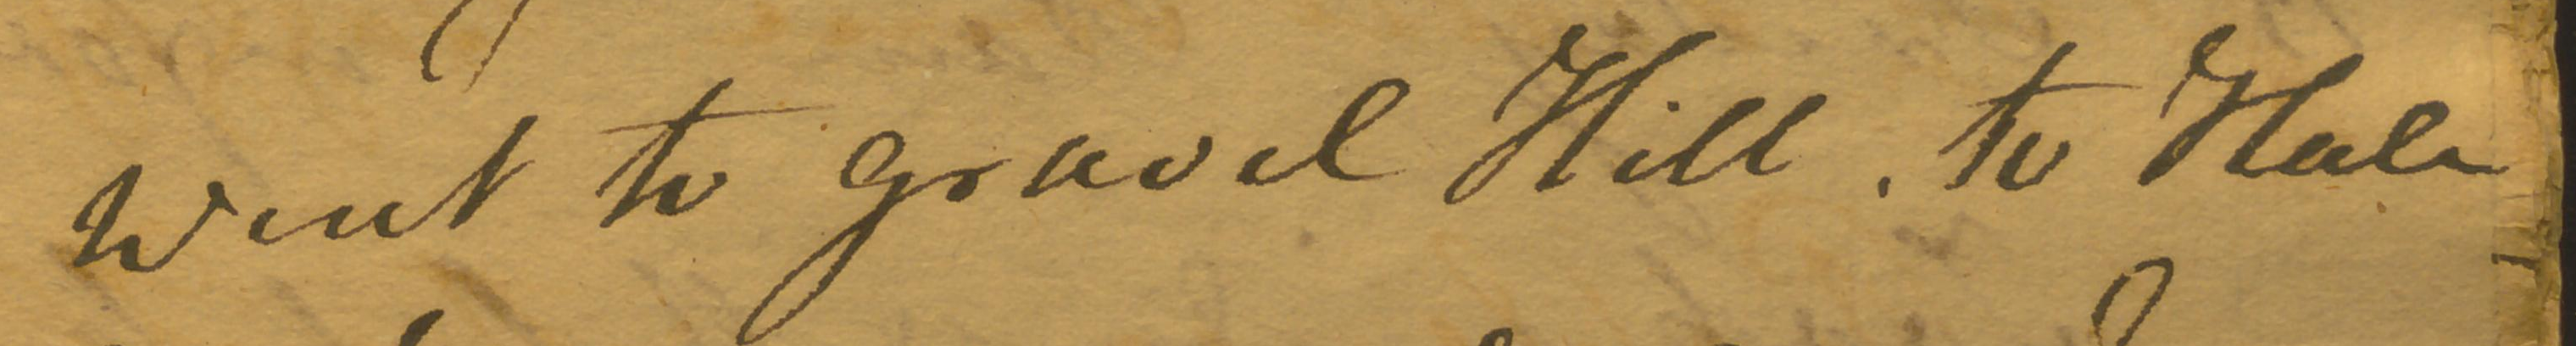grent to gravel Hill to Hale
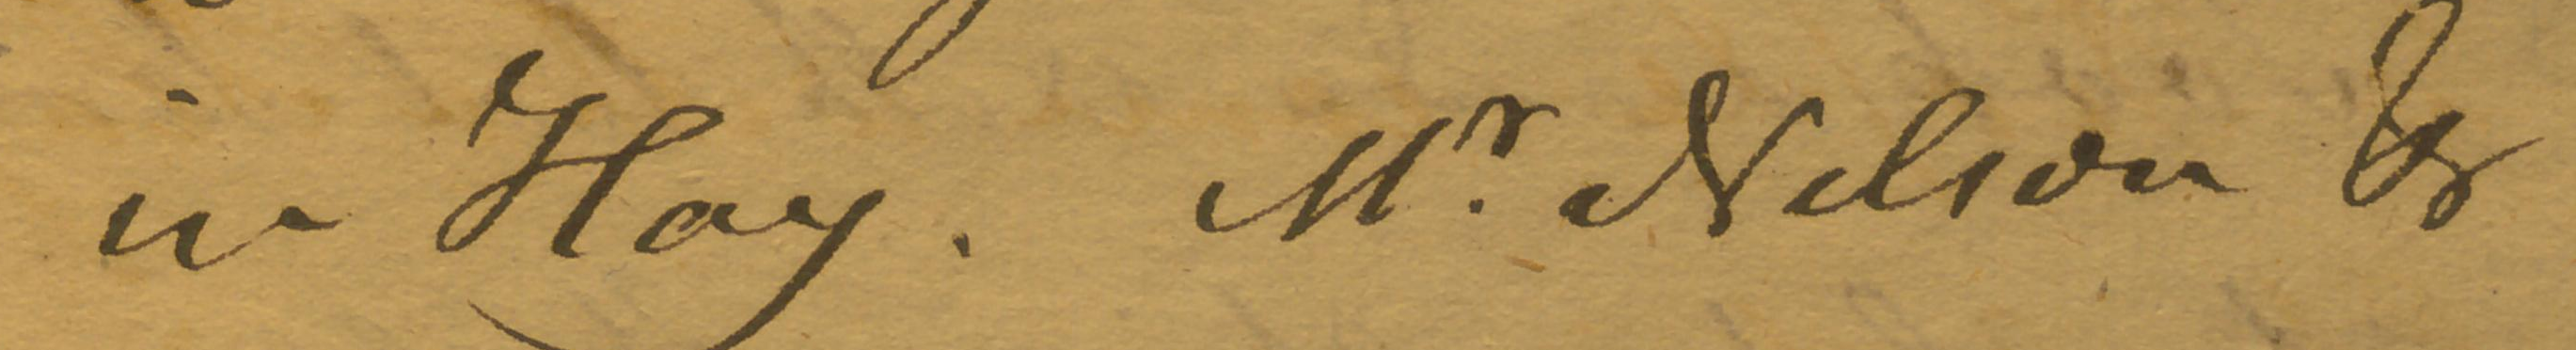is Hay, M^r. Nelson &
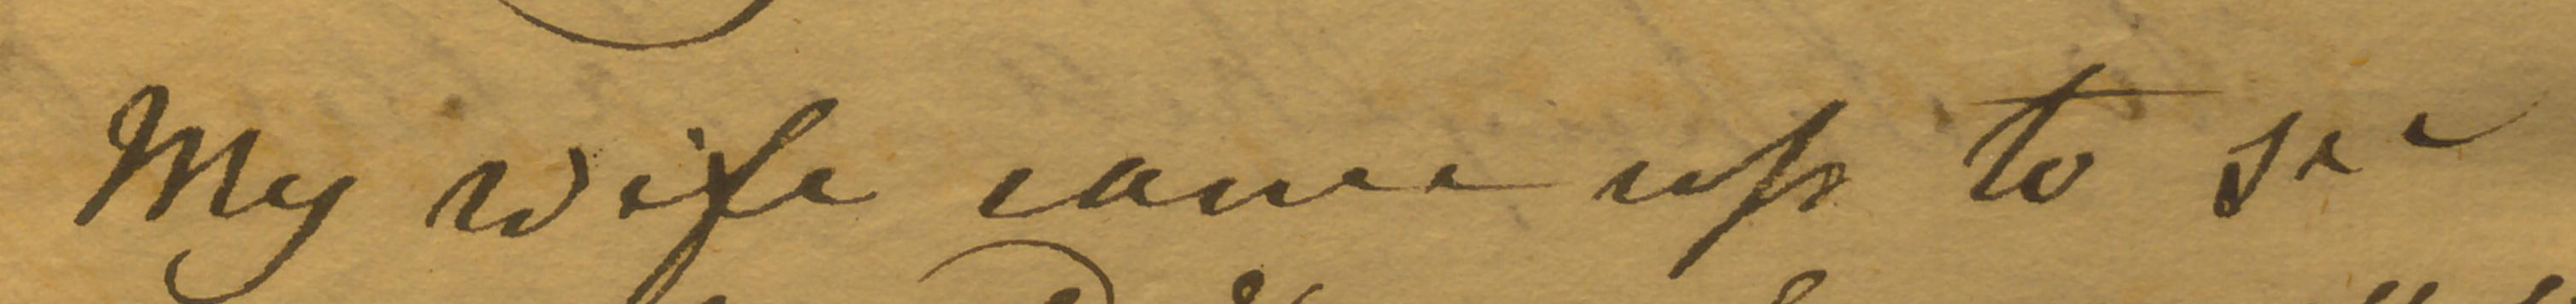My wife came up to see
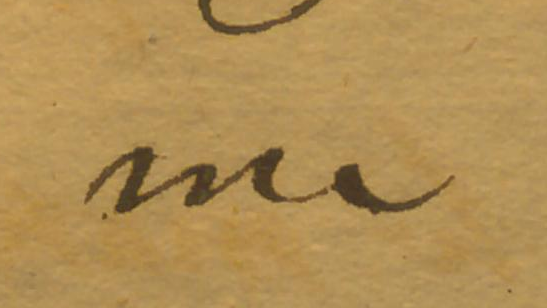me
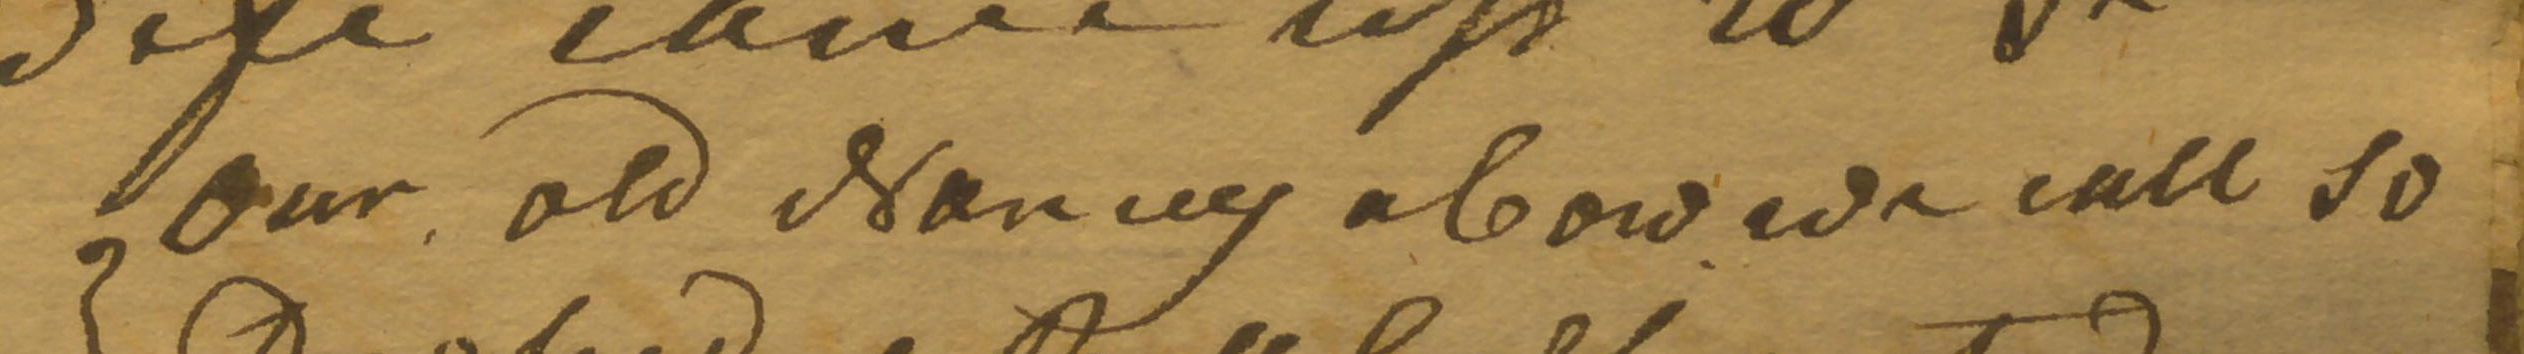our old Nancey a Cow we call so
